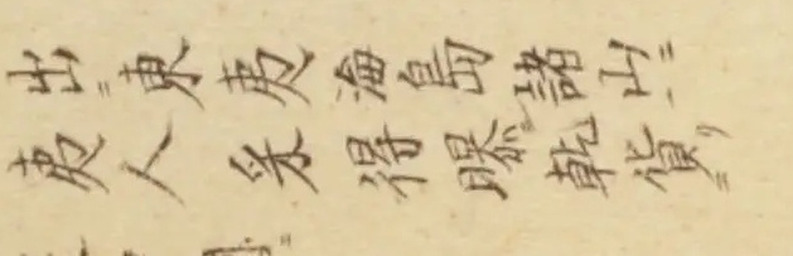夷人采得曝し乾貨く
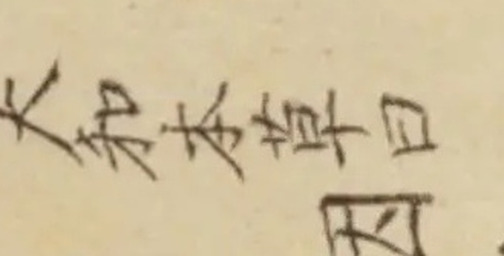大和本草曰
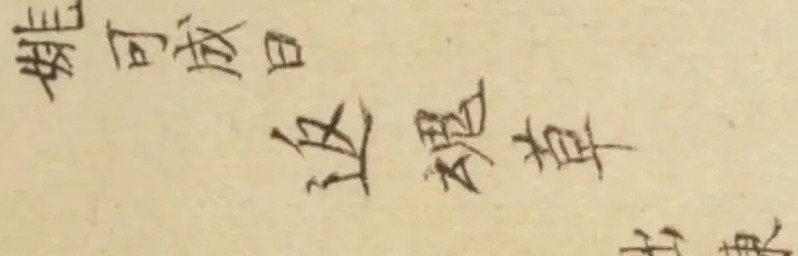返魂草
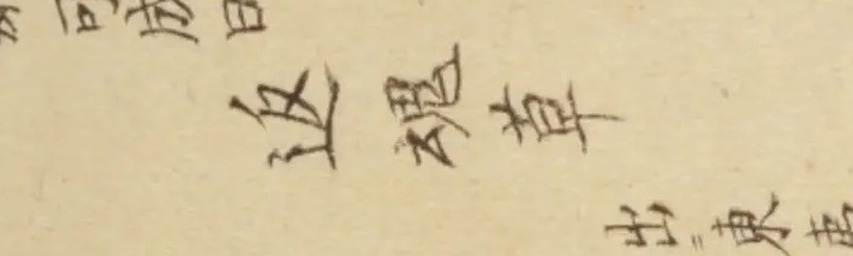返魂草
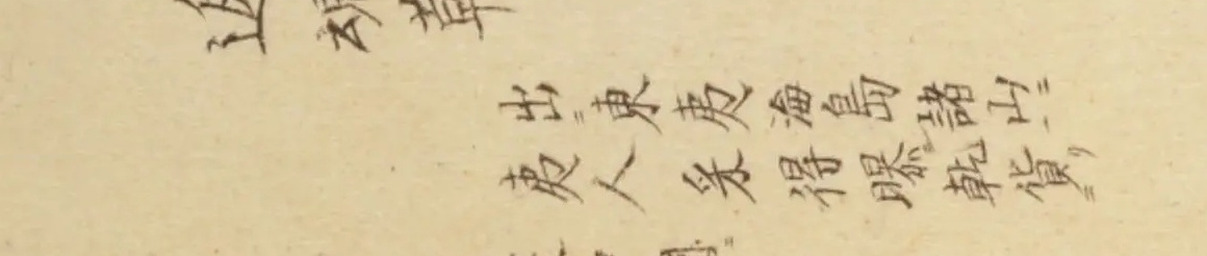出東夷海島諸山に
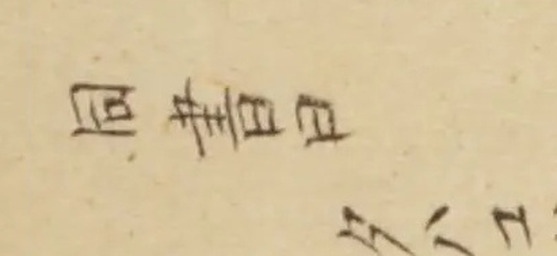同書曰
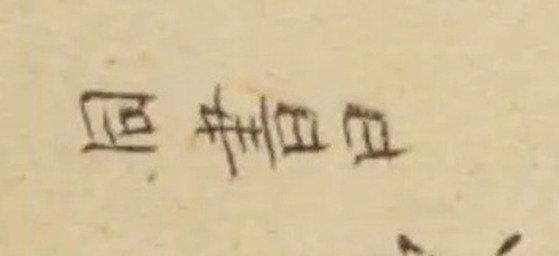同書曰

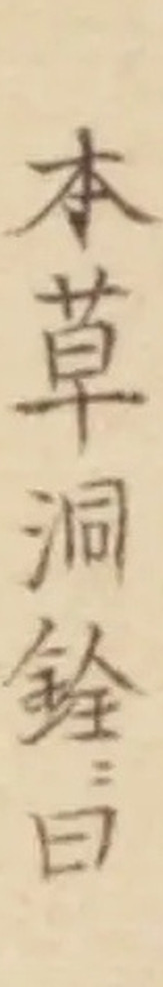本草洞銓に曰
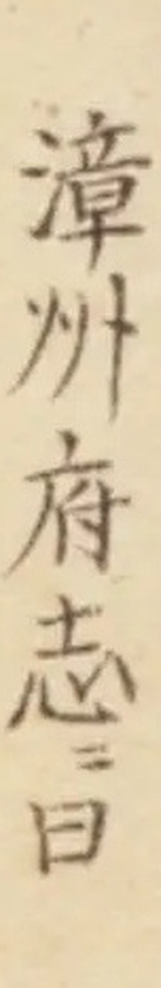漳州府志に曰
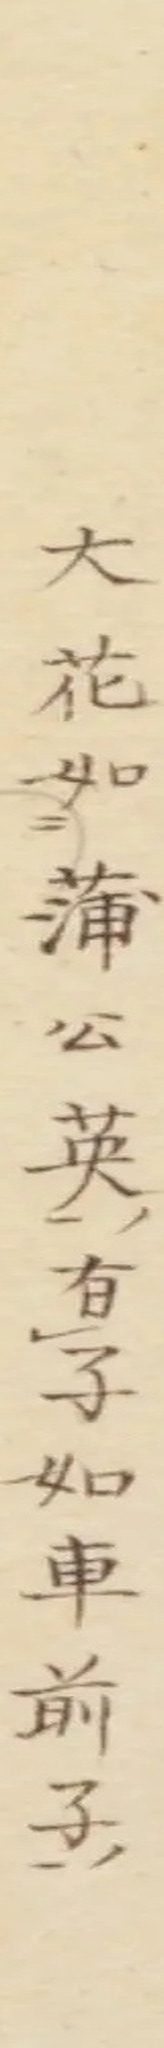大花如蒲公英の有子如車前子の
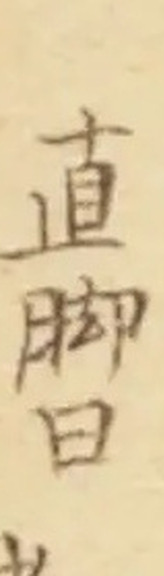直脚曰
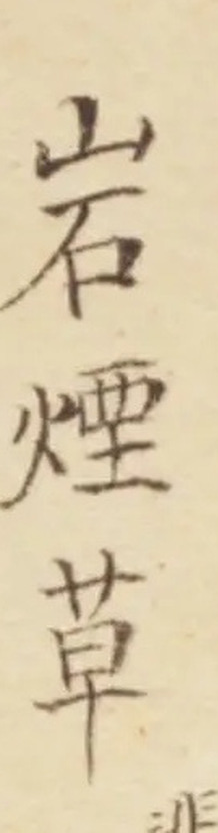岩煙草
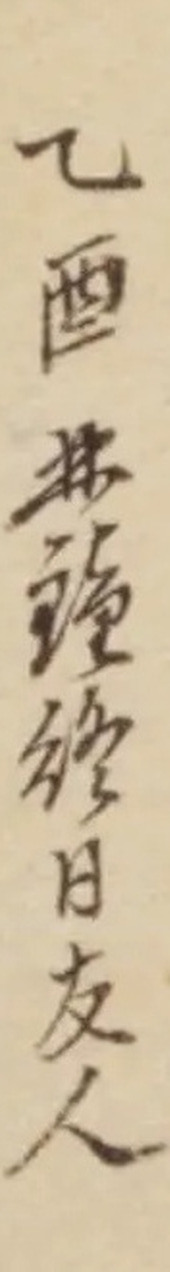乙酉林鐘終日友人
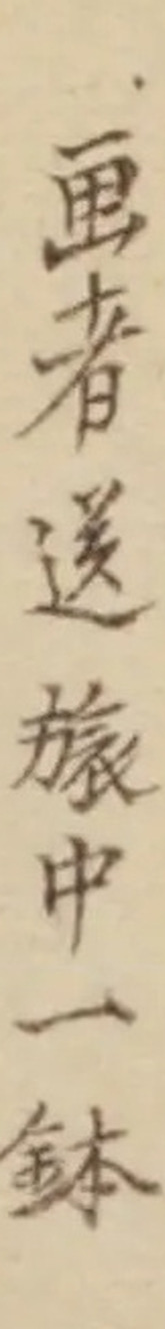画者送旅中一鉢

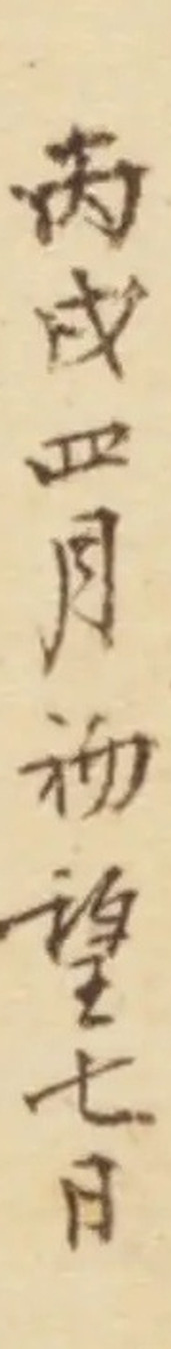丙戌四月初望七日
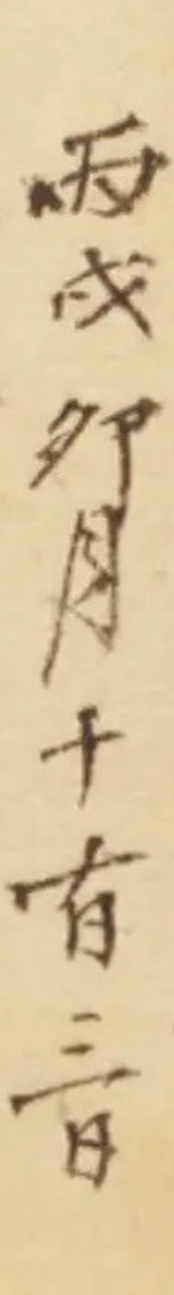丙戌卯月十有三日
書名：梅園草木花譜夏之部. 3
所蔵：国立国会図書館 National Diet Library, JAPAN
